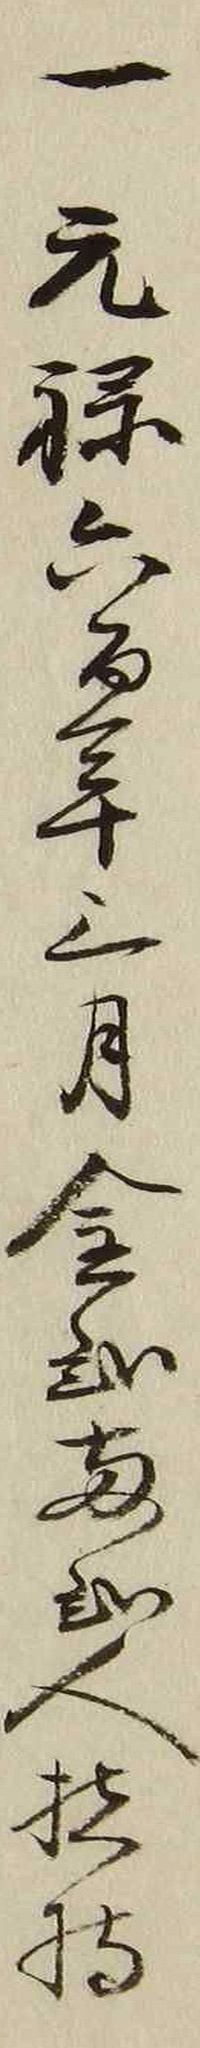一元禄六酉年三月金弐両弐人扶持
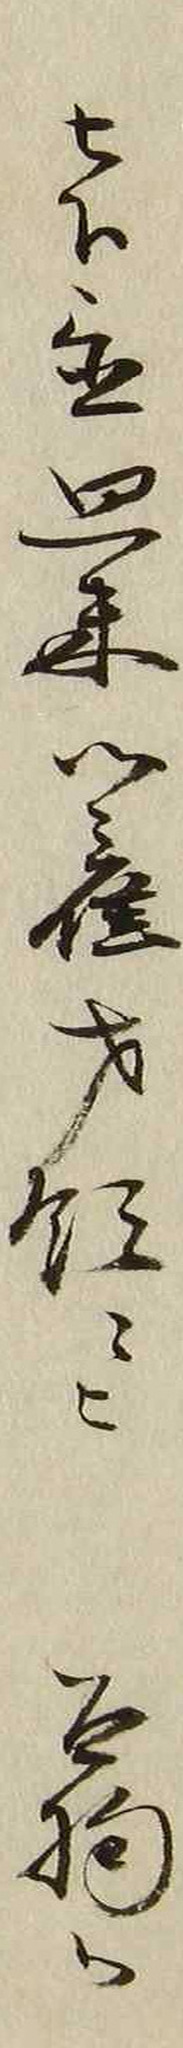被下置廻米御雇才領ニ被召抱候
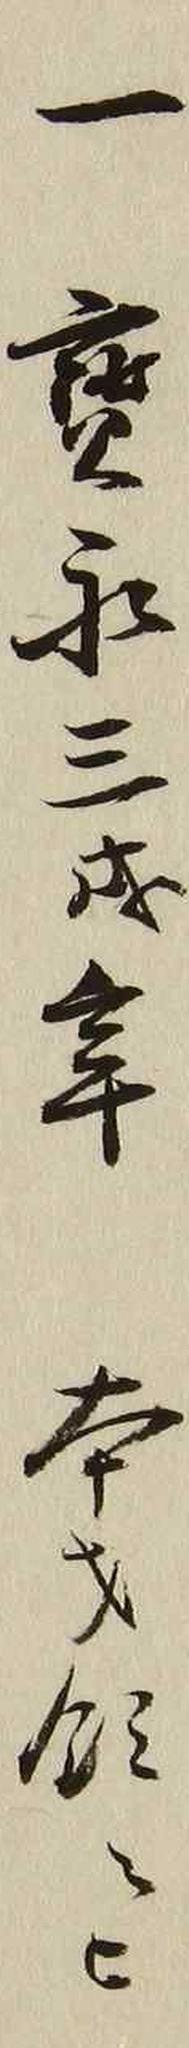一宝永三戌年本才領ニ被
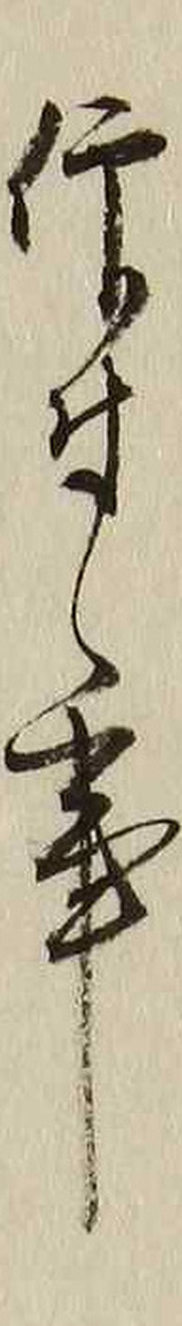仰付候事
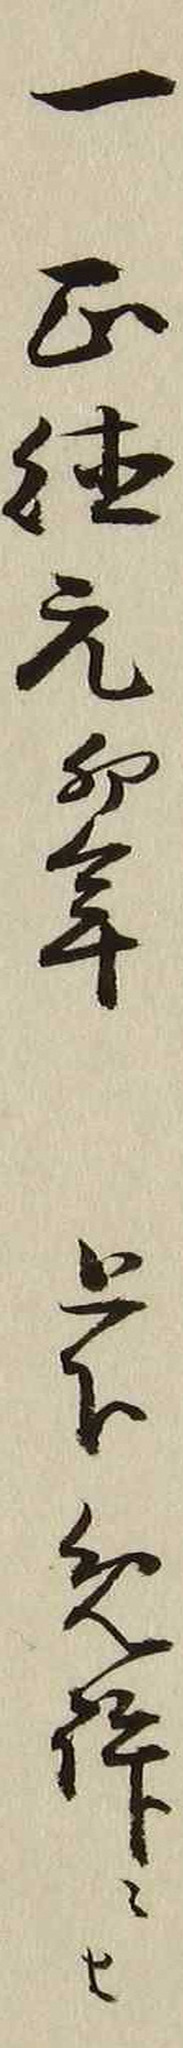一正徳元卯年上下免許ニ被
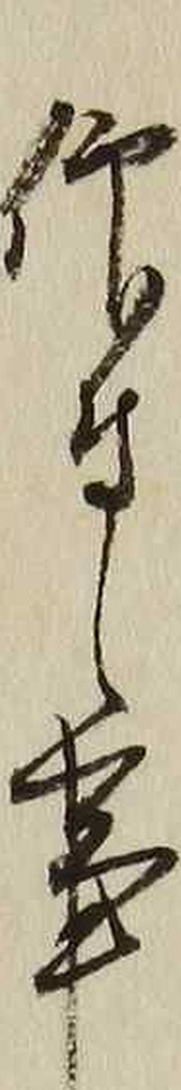仰付候事
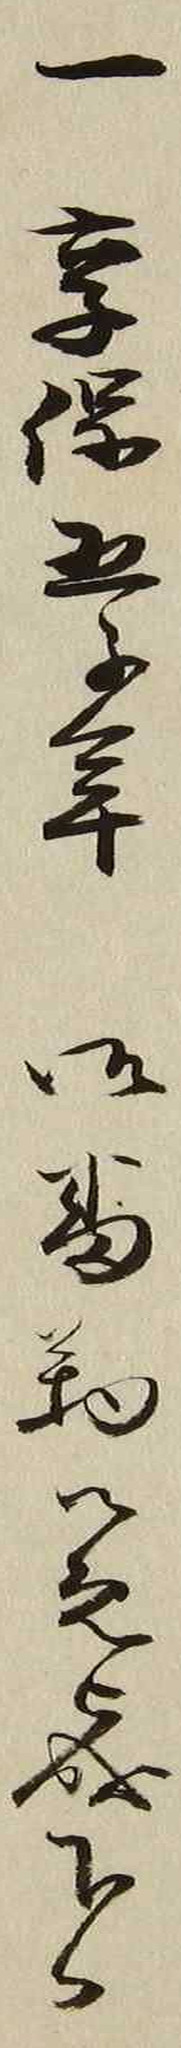一享保五子年御番勤御免被成下候
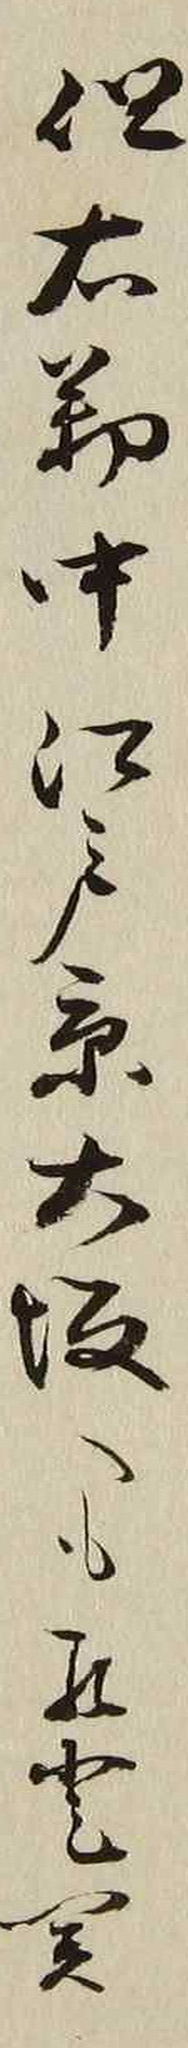但右勤中江戸京大坂へも罷登関
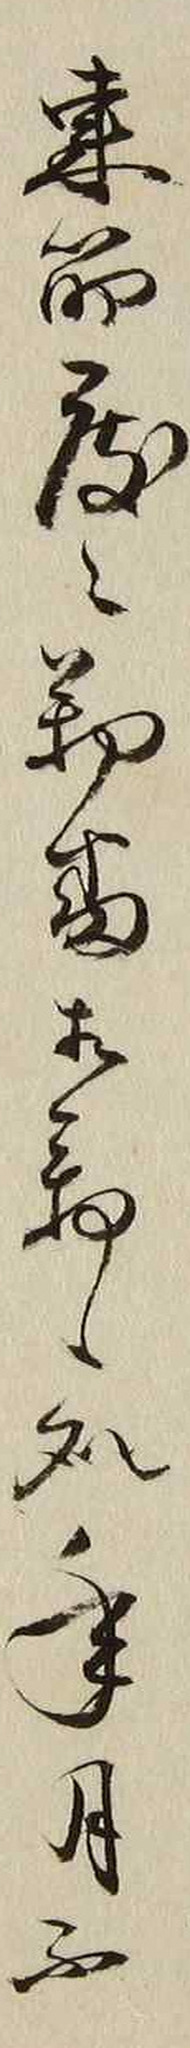東筋度々勤番相勤候処年月不
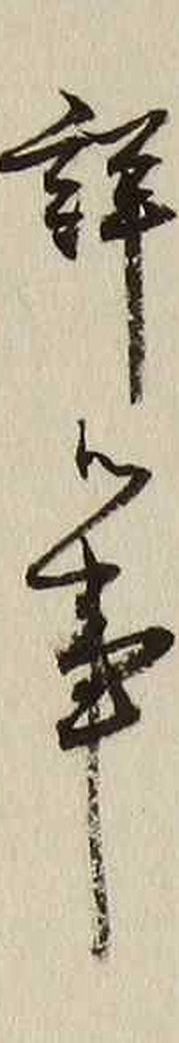詳候事
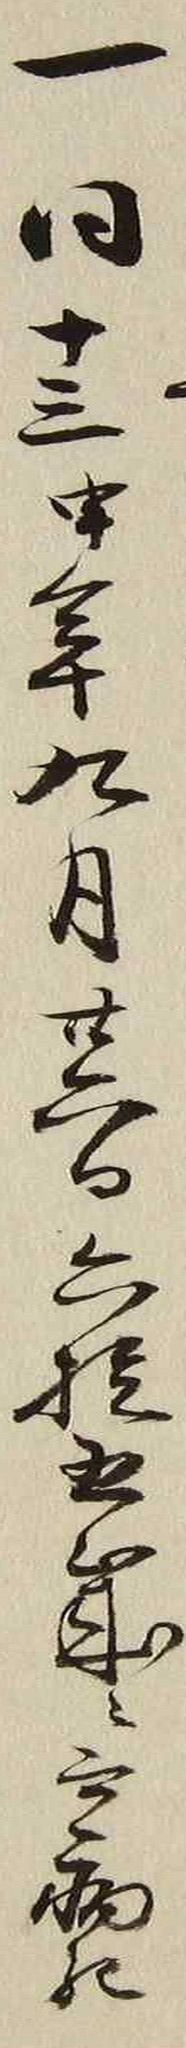一同十三申年九月廿六日六拾五歳ニ而病死
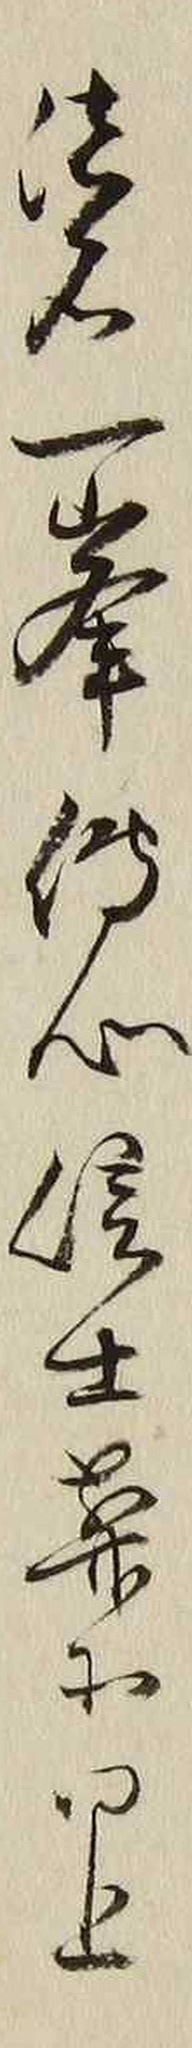法名一峰伝心信士葬所同上
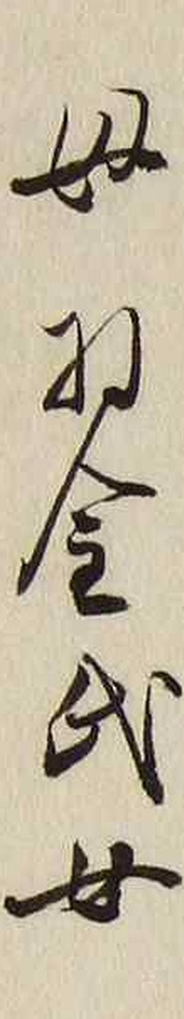母羽金氏女

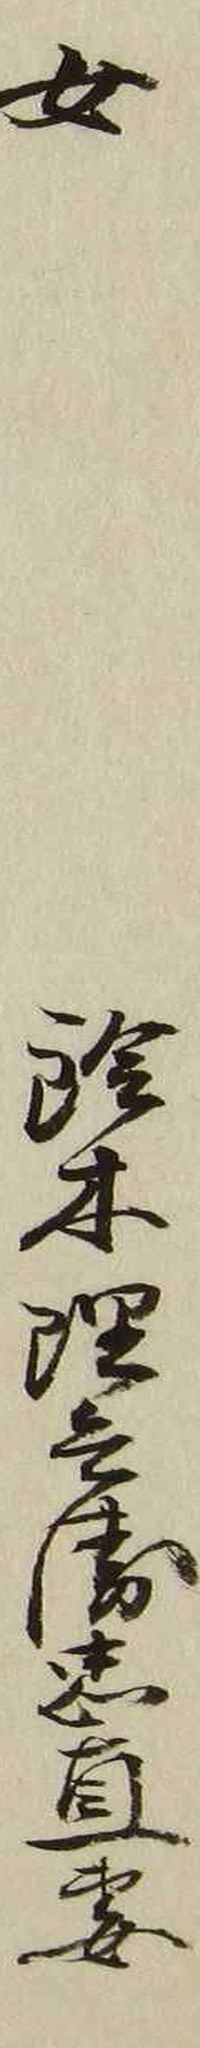女鈴木理兵衛忠直妻
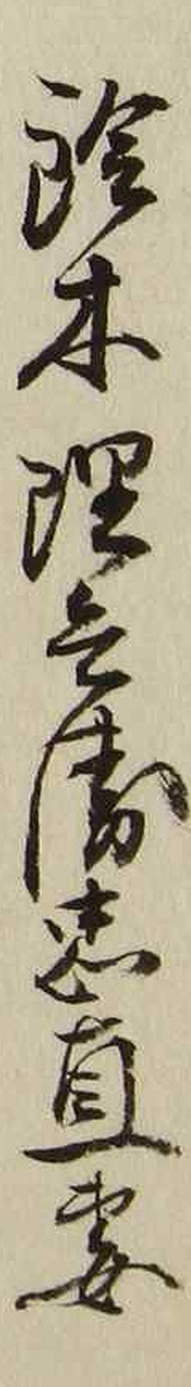女鈴木理兵衛忠直妻
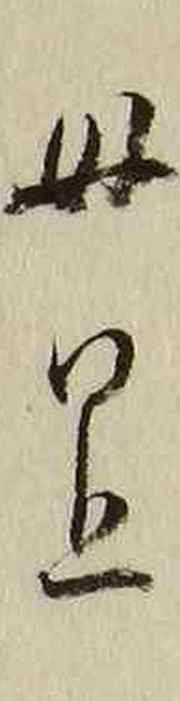母同上
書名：諸士系譜　巻之291　さ之部23
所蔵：会津若松市立会津図書館
